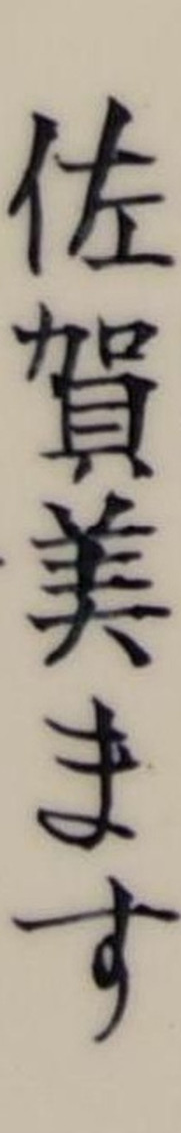佐賀美ます
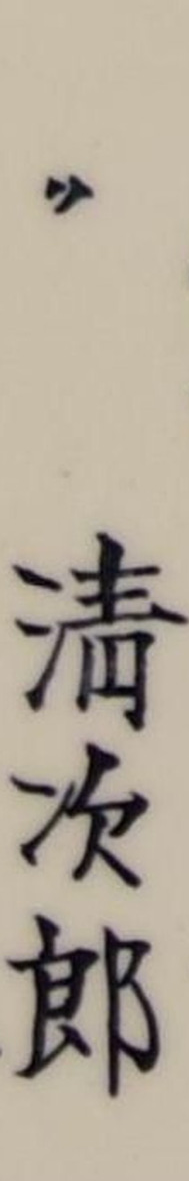清次郎
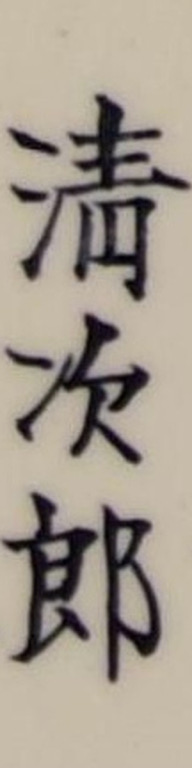清次郎
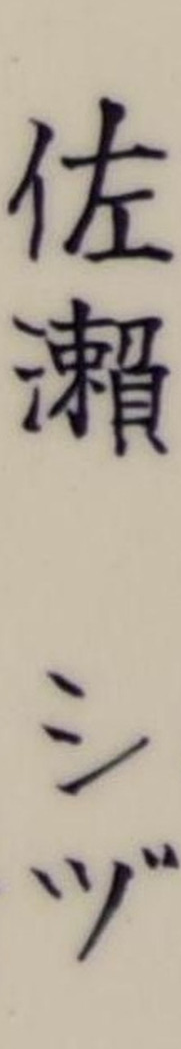佐瀬シヅ
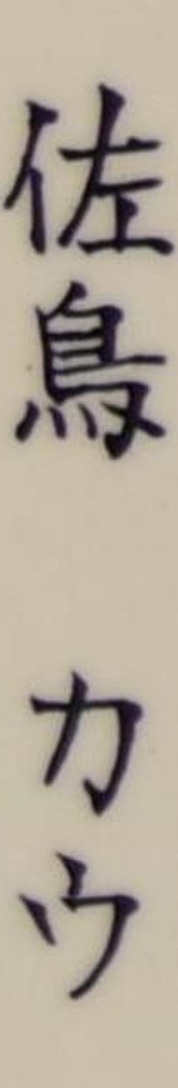佐鳥カウ

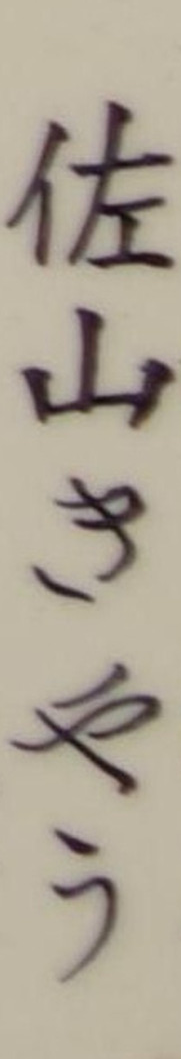佐山きやう
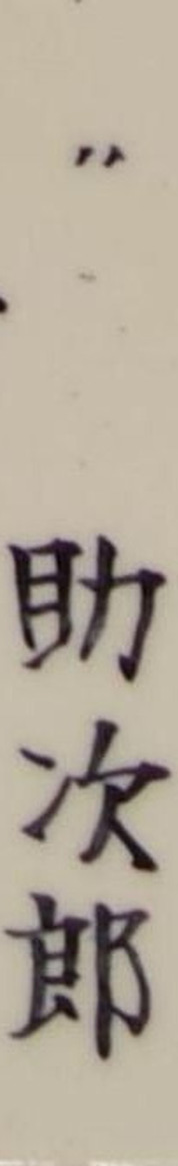助次郎
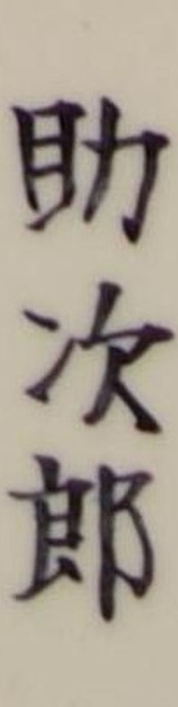助次郎
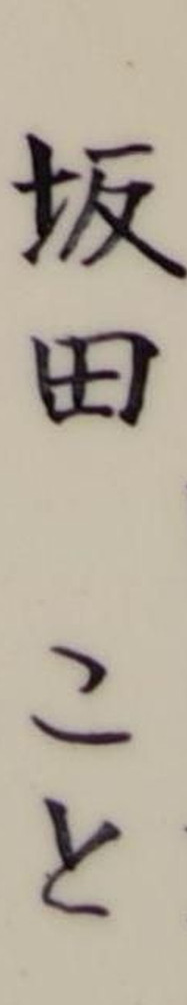坂田こと
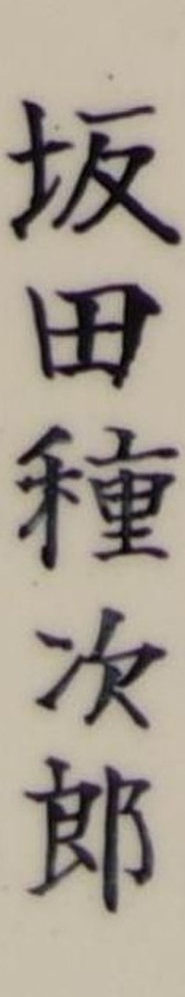坂田種次郎
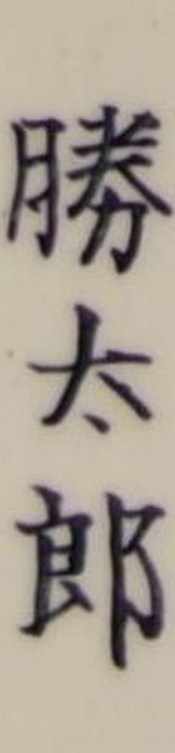勝太郎
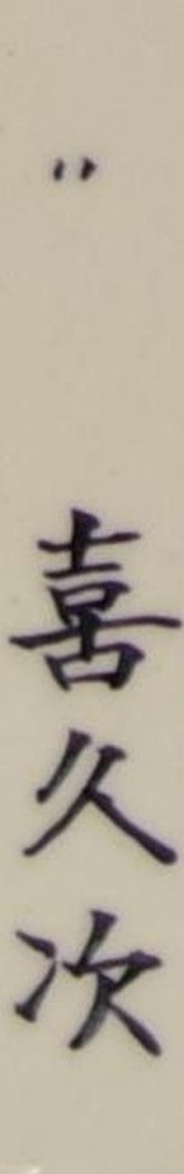喜久次
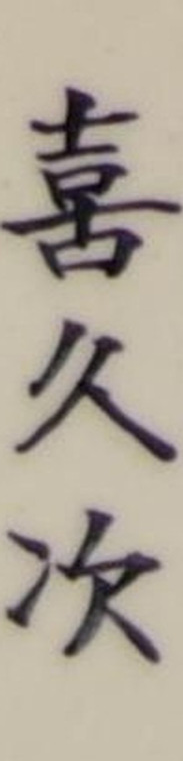喜久次
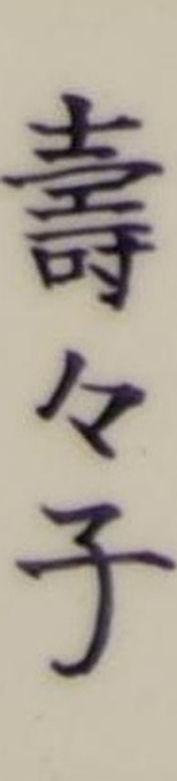壽々子
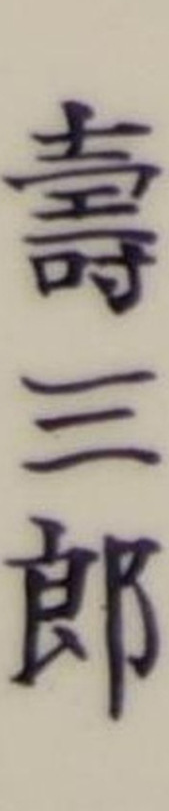壽三郎
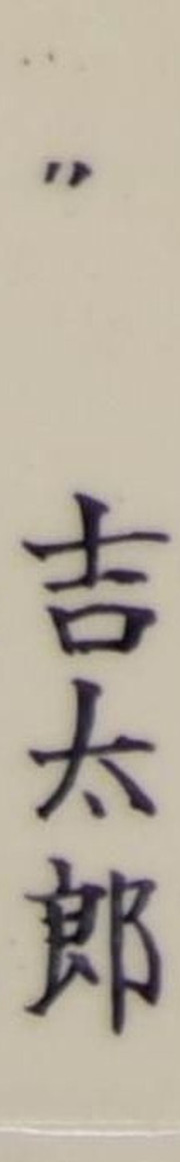吉太郎
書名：E~L
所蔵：高野山金剛峯寺
